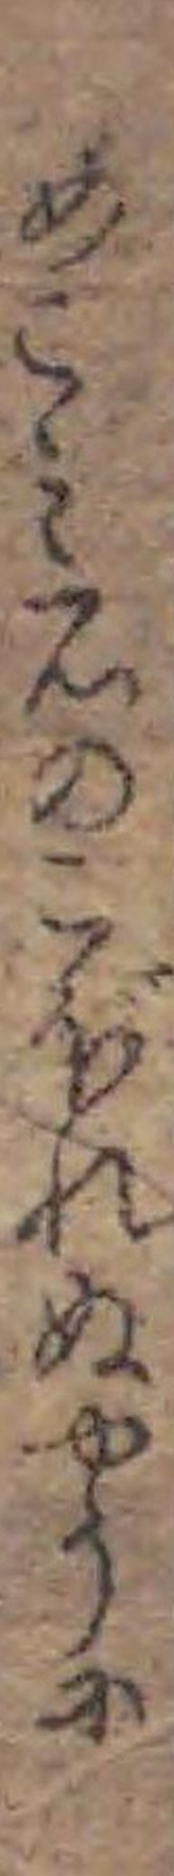めこみ石のこぼれぬやうに
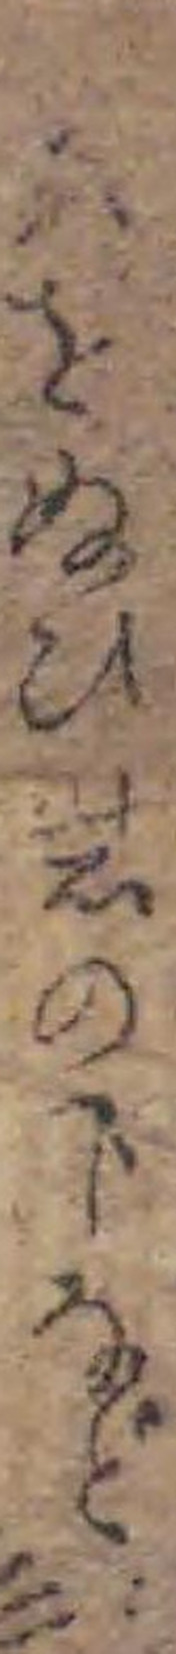をぬひ岩の下などに
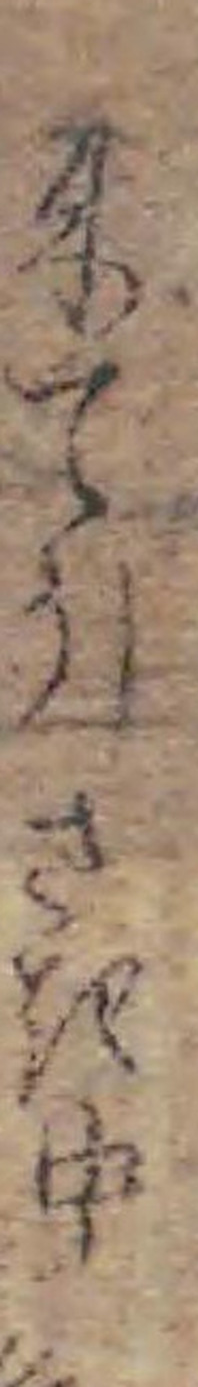置て引さき中
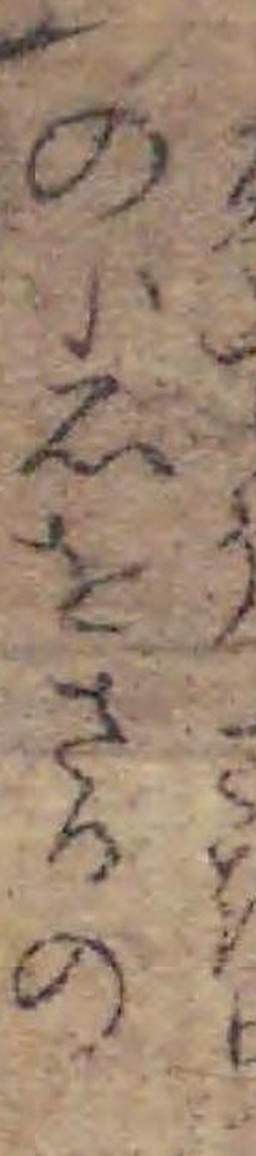の小石をさるの
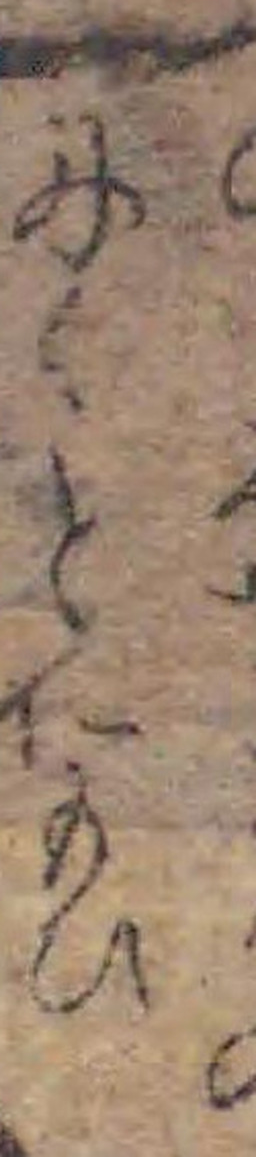にくとおもひ
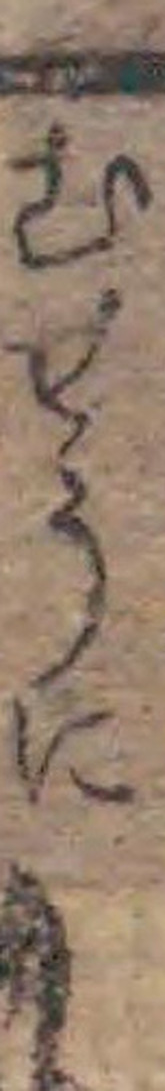むせうに
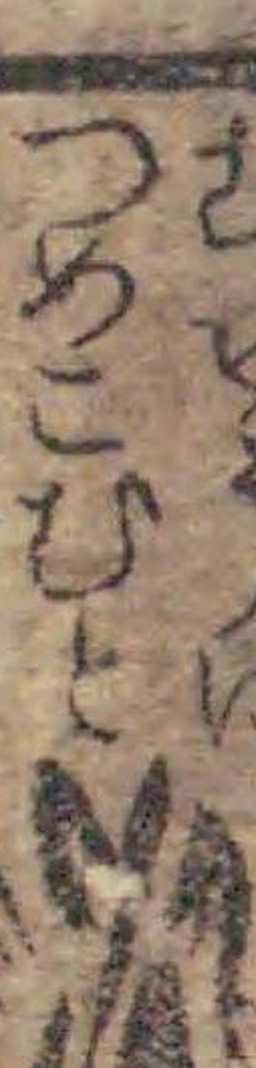つめこむと
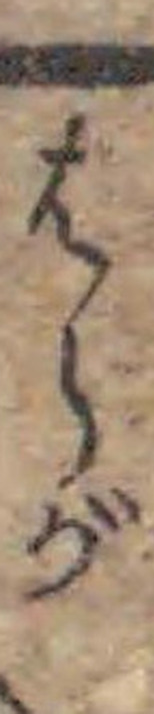はらが
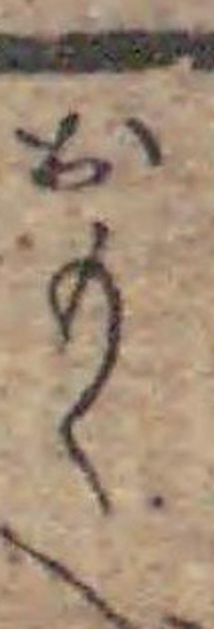おもく
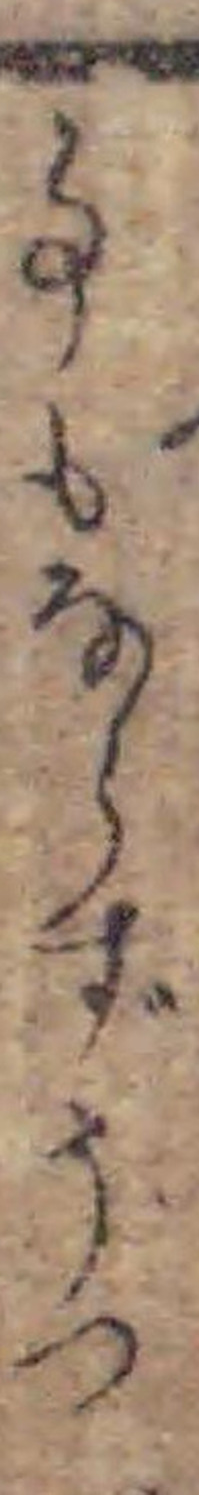事もならずうつ
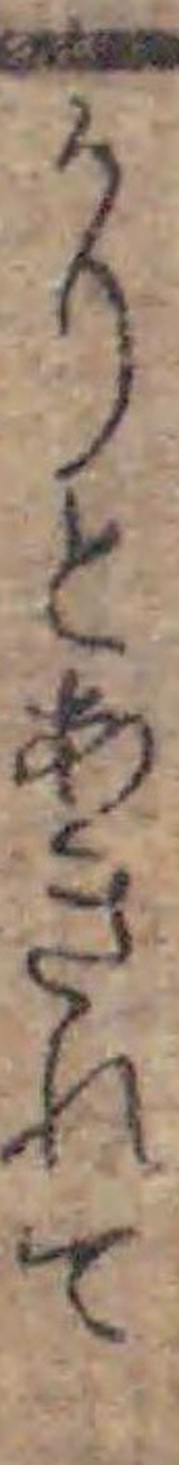かりとあきれて
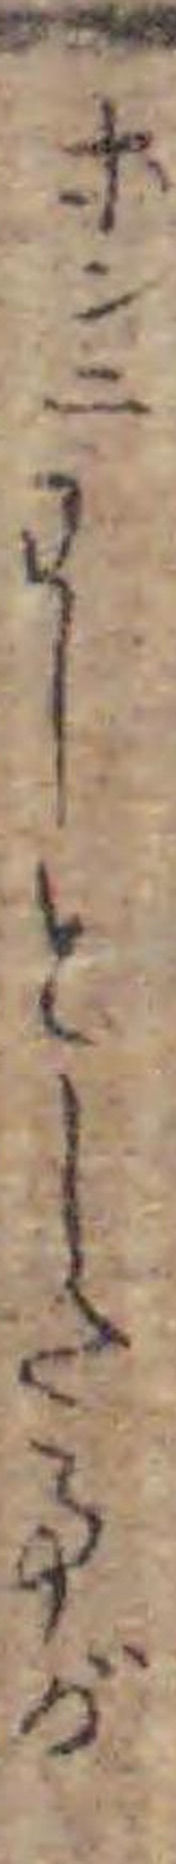ホンニわしとした事が
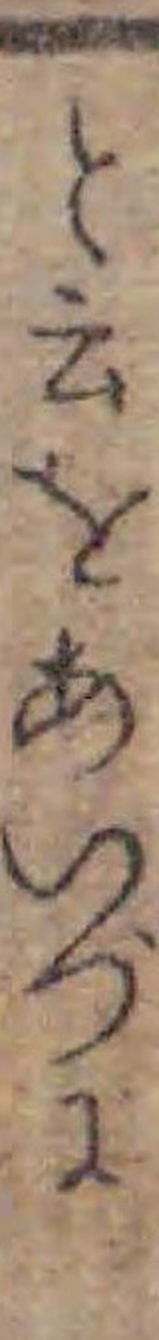と云をあいづに
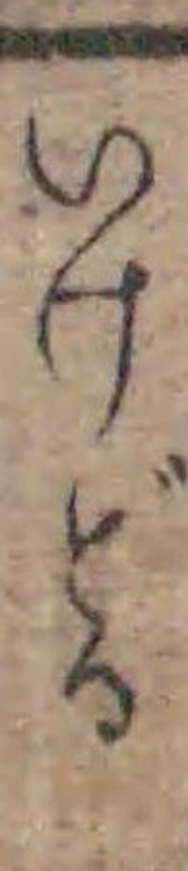いけどる

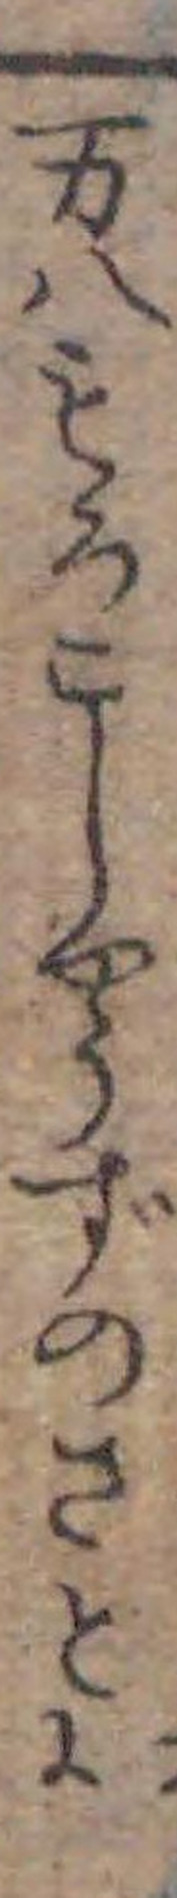万八もろこしやうずのさとに
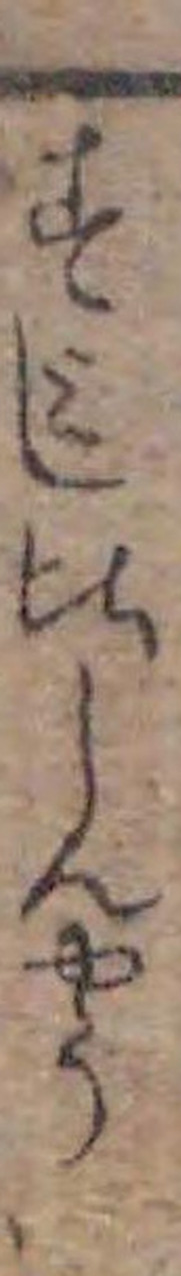すみし比しんやう
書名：虚言八百万八伝 : 3巻
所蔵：国立国会図書館 National Diet Library, JAPAN
